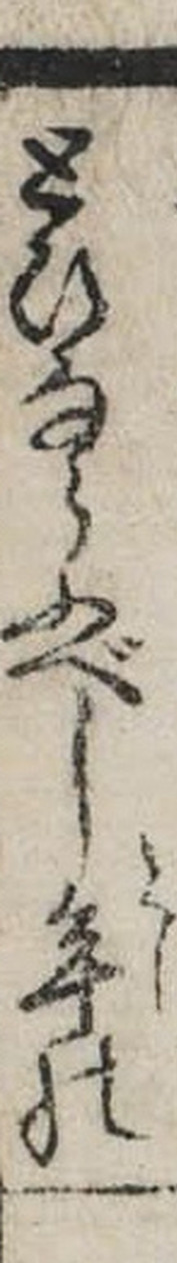とひならふべし年の

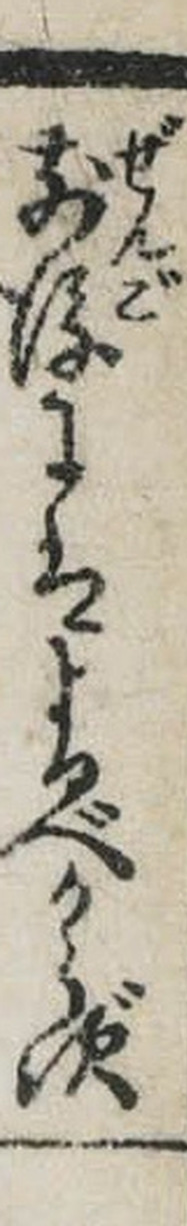前後にはよるべからず
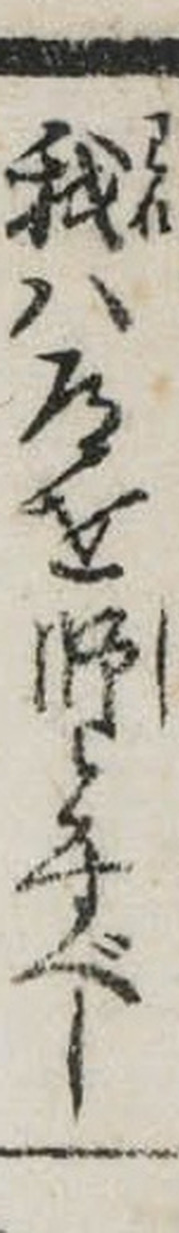我は道を師とすべし
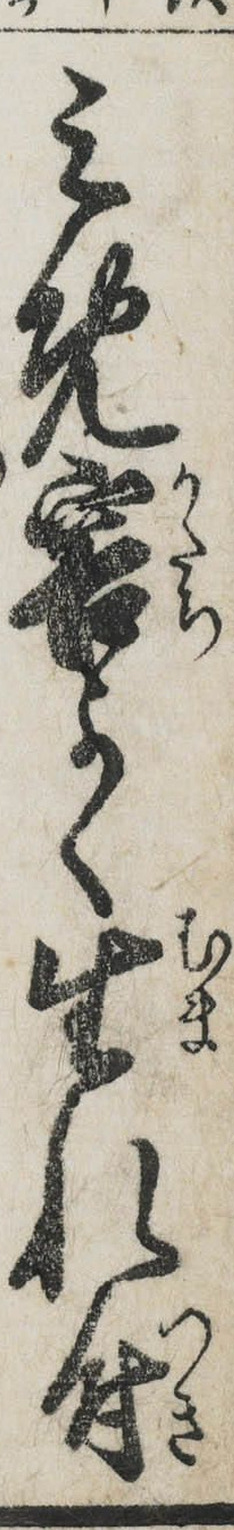みめ容よく生れ付
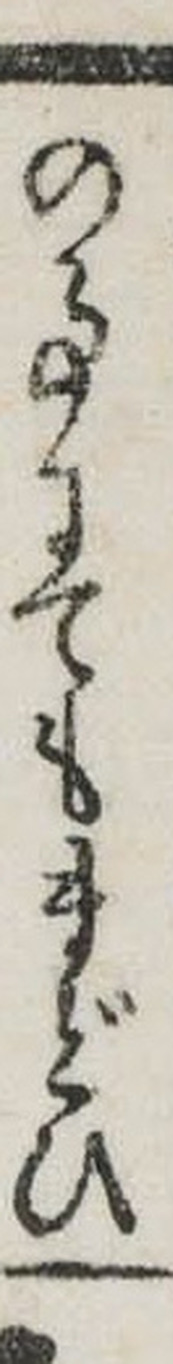の事にてもまどひ
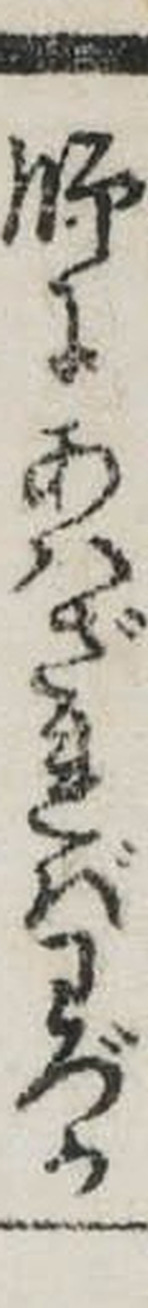師にあはざればわづか
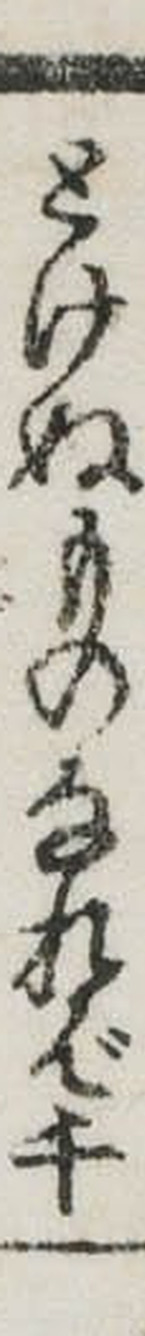とけぬものなれば千
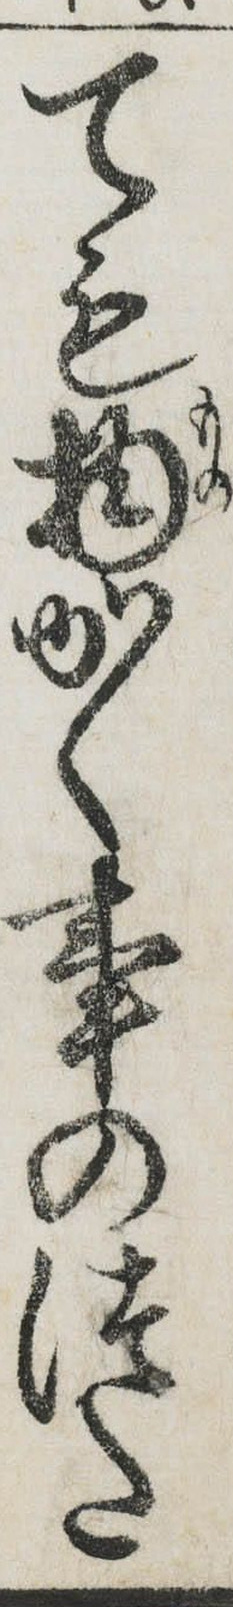ても物かく事のつた
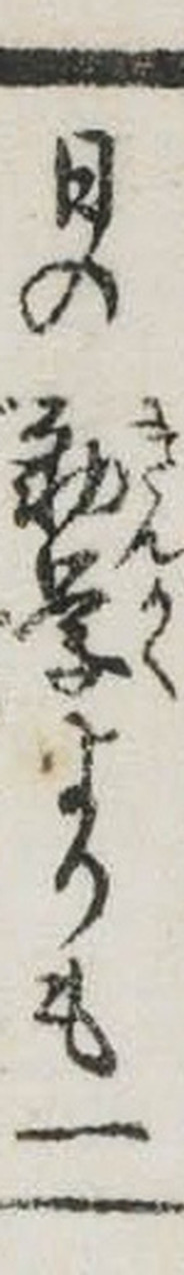日の勤学よりも一
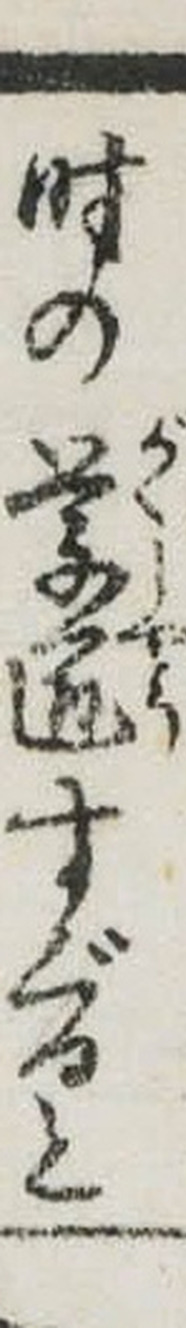時の学匠すぐると
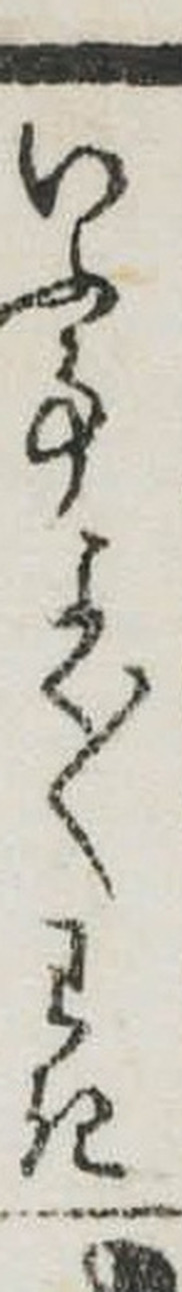いふ事よく〳〵わき
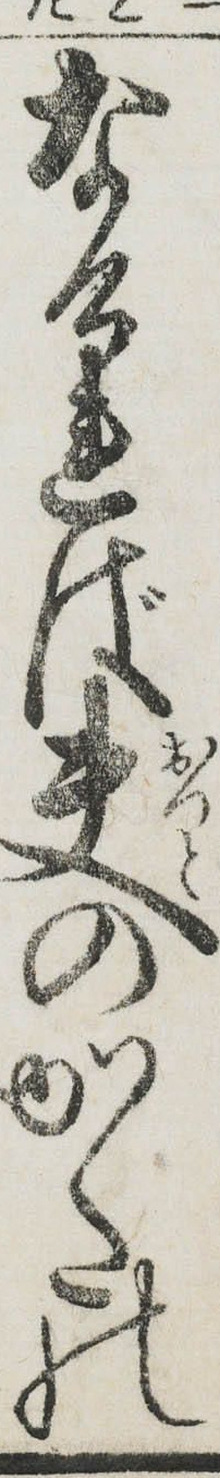なければ夫のかたの
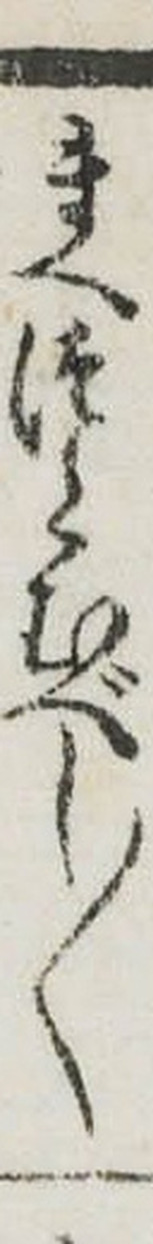まへつとむべし〳〵
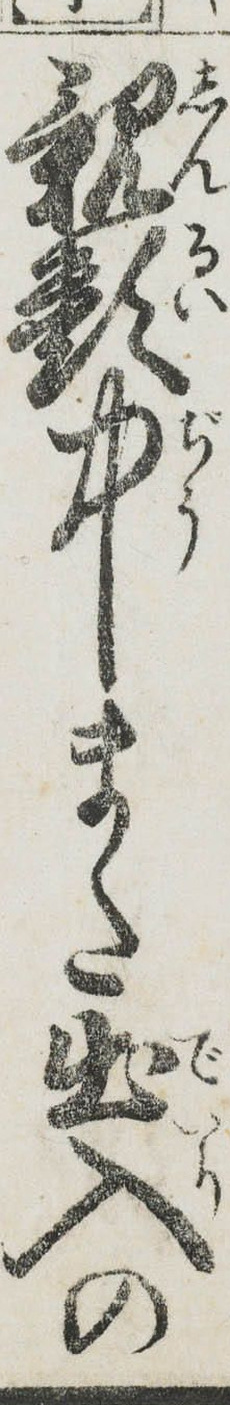親類中また出入の
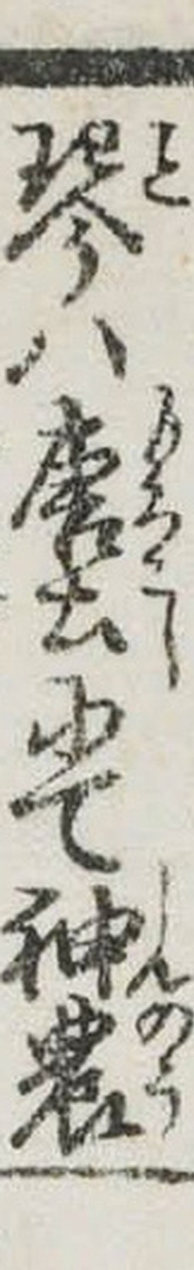琴は唐土にて神農
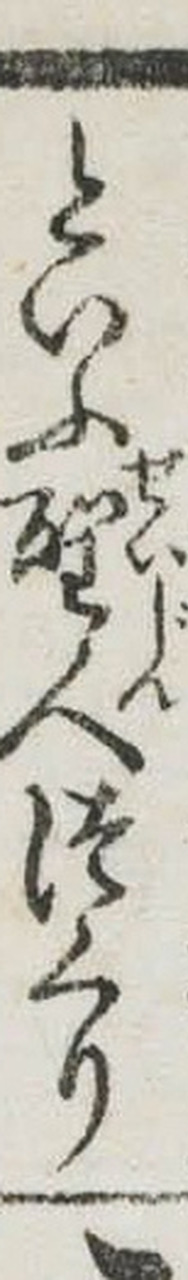といふ聖人つくり
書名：頭書萬用婦人手紙之文言
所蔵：東京学芸大学教育コンテンツアーカイブ
